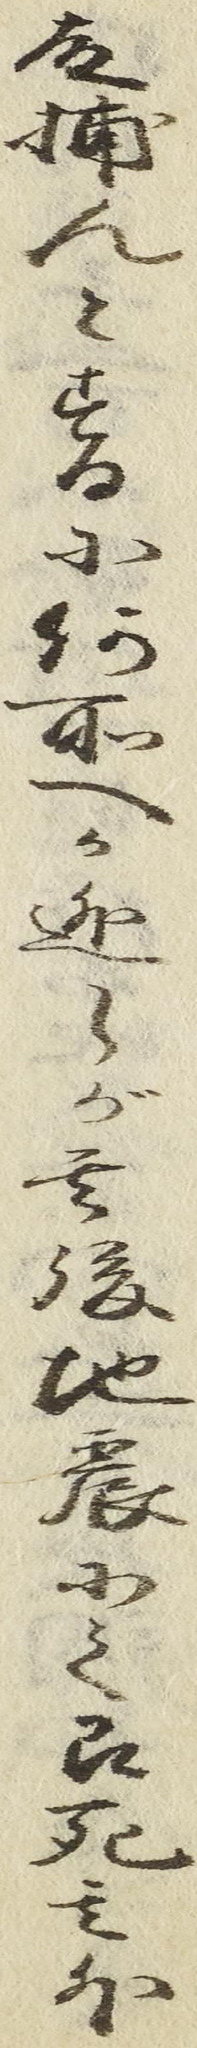故捕んとするに何所へか逃しが其後地震にて即死其外
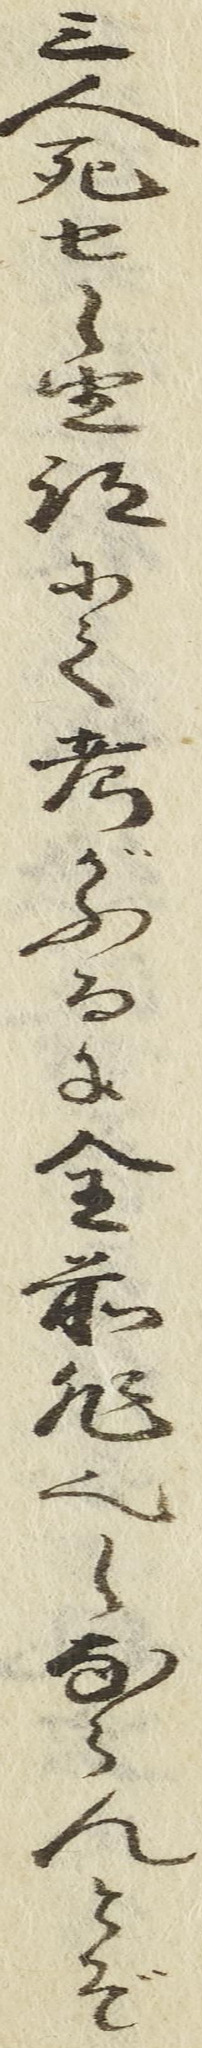三人死せし由跡にて考がふるに全前兆也しならんとぞ
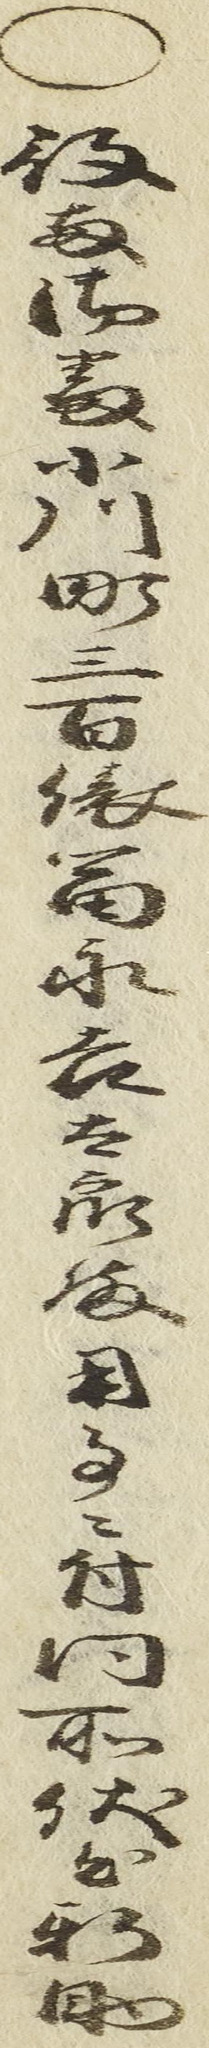○役両御番小川町三百俵冨永吉太郎殿用事ニ付同所伏出新助
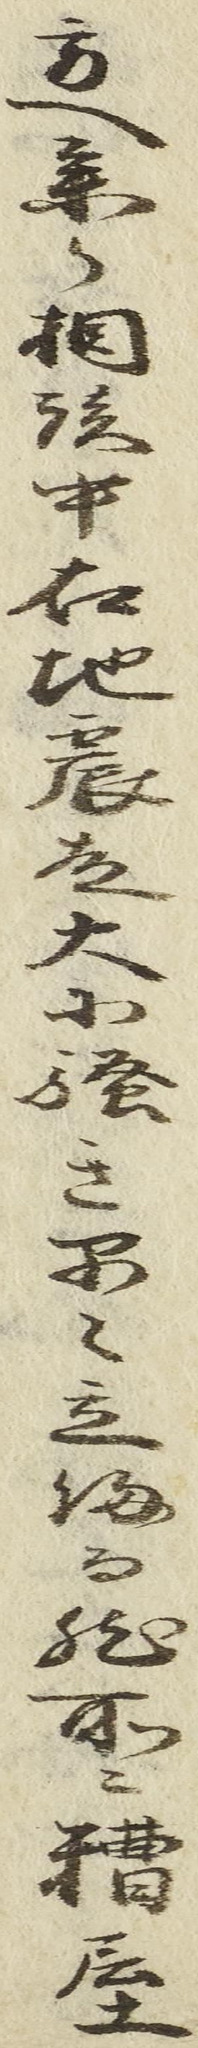方へ参り相談中右地震故大に騒き早々立帰る然所ニ糟屋
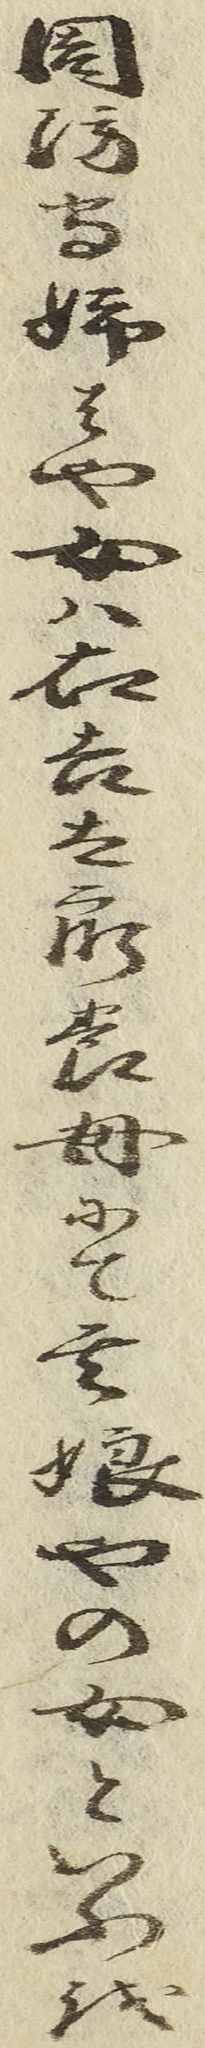周防守姉はや女は右吉太郎養母にて其娘やの女といふを

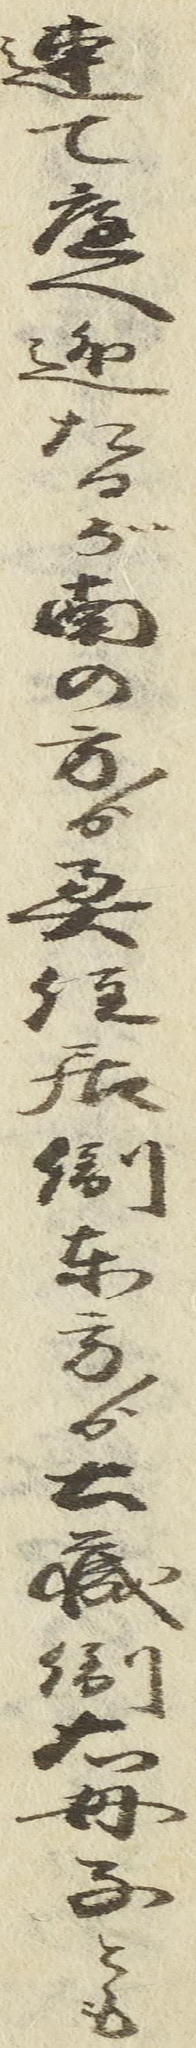連て庭へ逃たるが南の方ゟ奥住居倒東方ゟ土蔵倒右母子とも
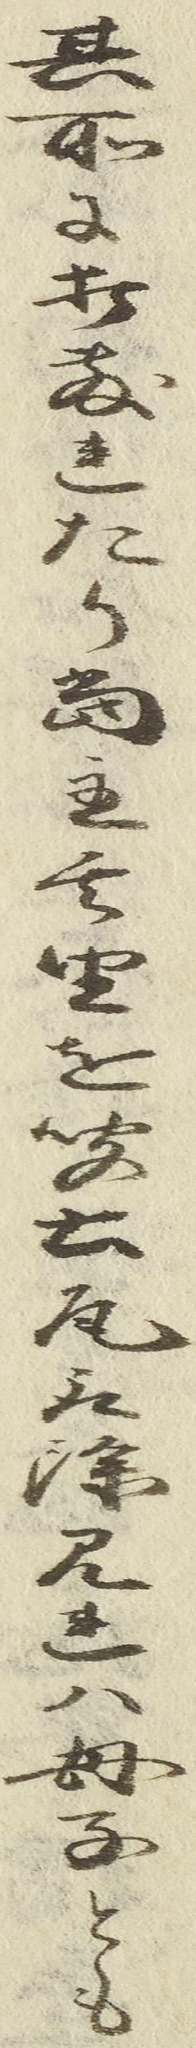其所に打敷れたり当主其由を聞土瓦取除見れは母子とも
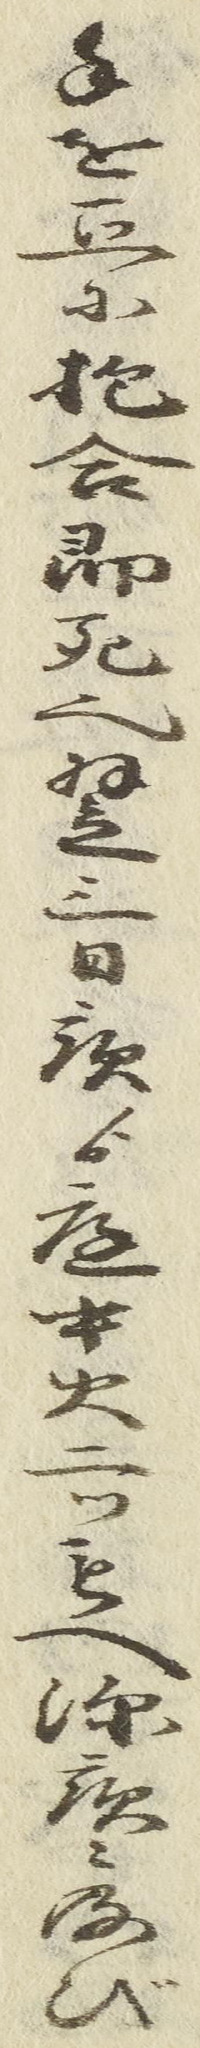手を互に抱合即死也翌三日夜ゟ庭中火二ツもへ深夜ニ及び
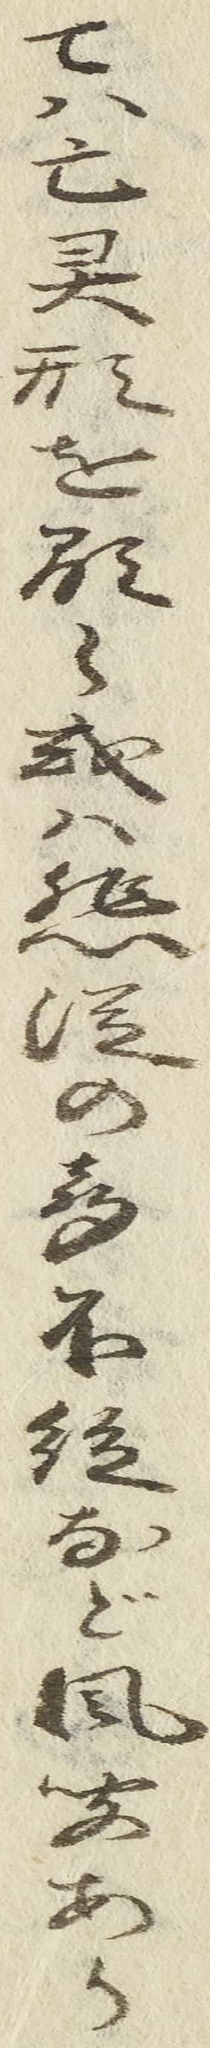ては亡霊形を顕し或は悲泣の声不絶など風聞あり
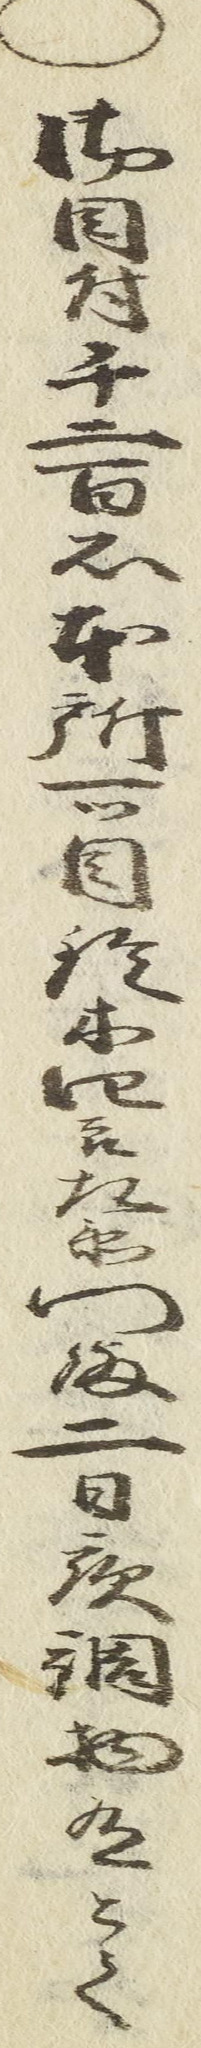○御目付千二百石本所一ツ目鈴木四郎左衛門殿二日夜調物有とて
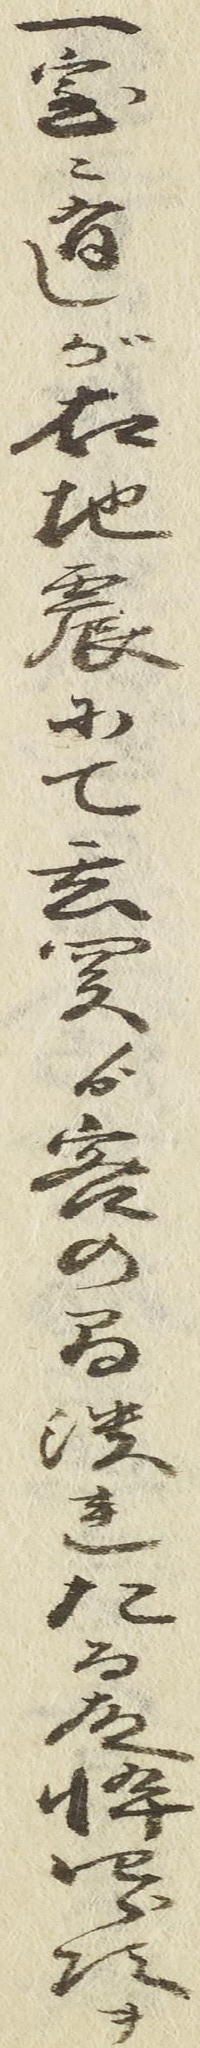一室ニ有しが右地震にて玄関ゟ客の間潰れたる故悴四郎次ヲ
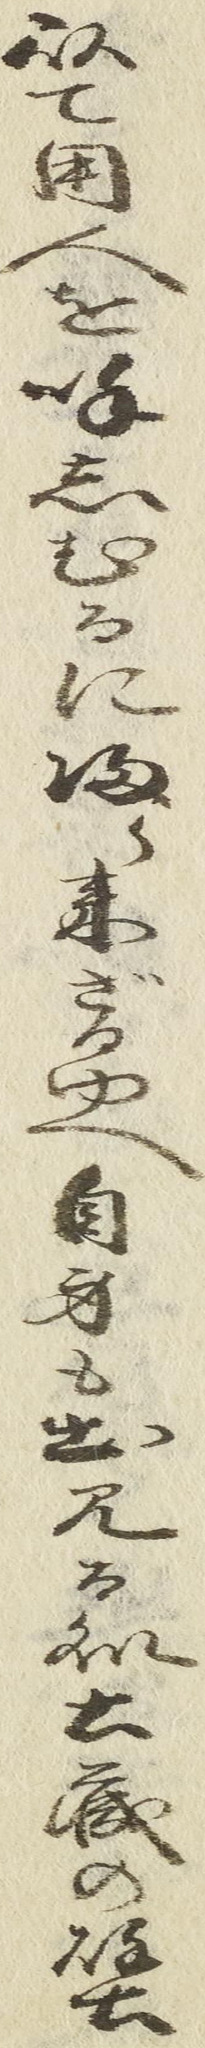以て用人を呼しむるに帰り来ざるゆへ自身も出見る処土蔵の壁
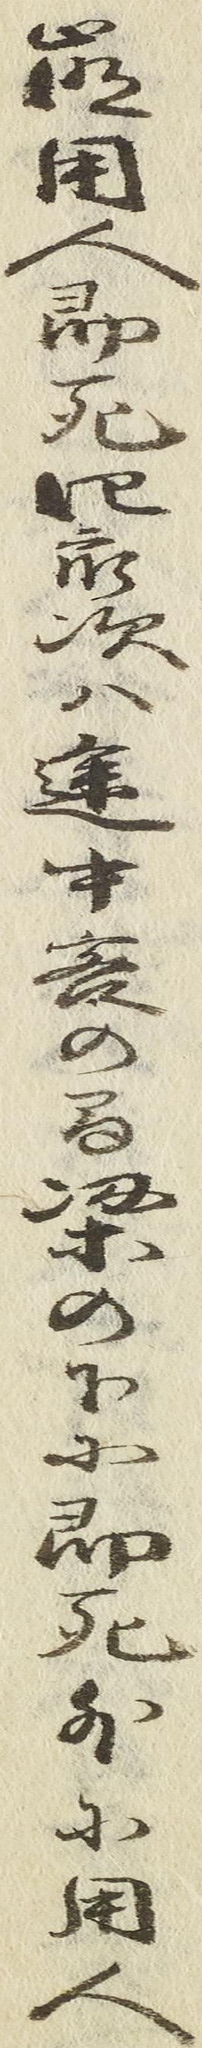崩用人即死四郎次は途中客の間梁の下に即死外に用人
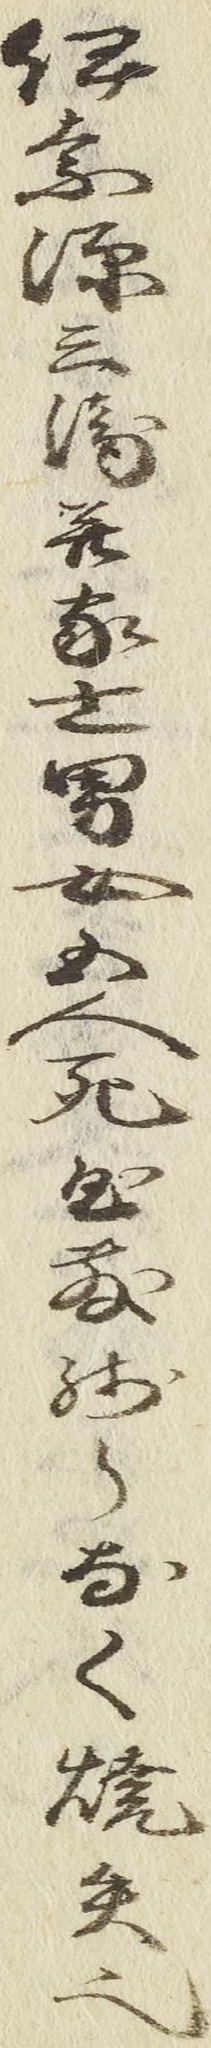伊奈源兵衛幷家士男女五人死屋敷残りなく焼失也
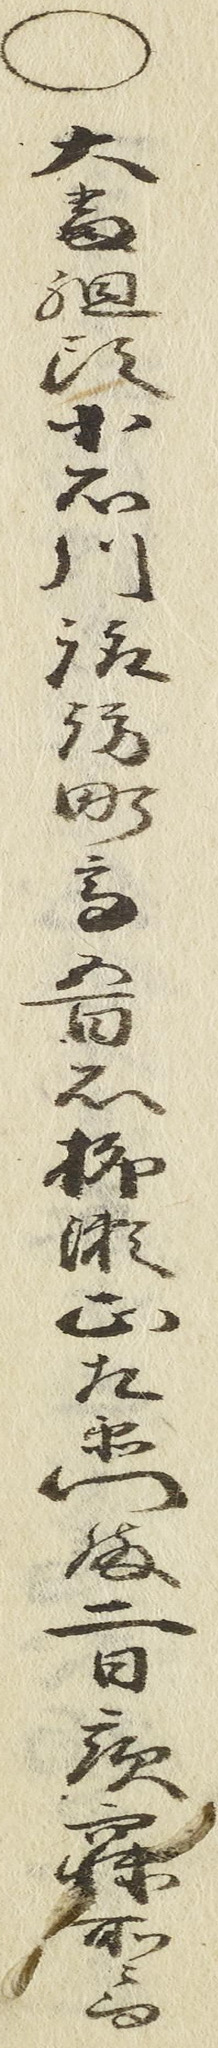○大番組頭小石川諏訪町高五百石柳瀬正左衛門殿二日夜寝所二而
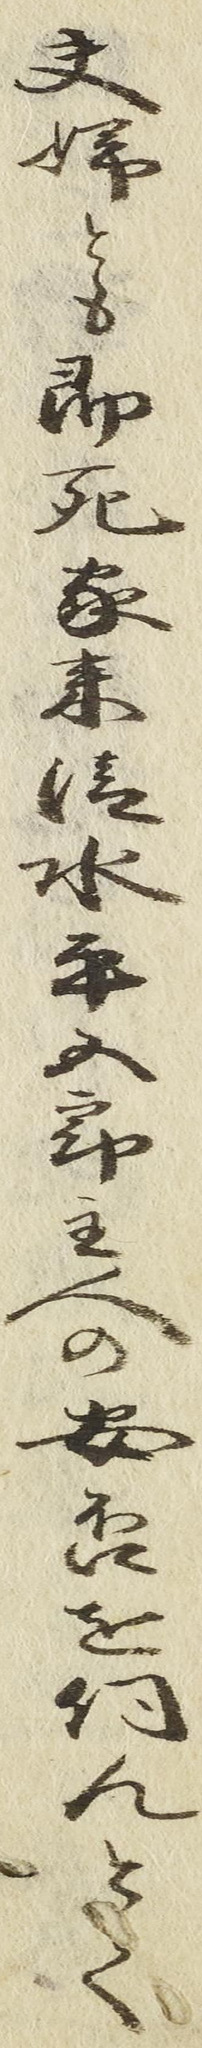夫婦とも即死家来清水平五郎主人の安否を伺んとて
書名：安政二年震災記事　完
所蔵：東京大学地震研究所図書室 Earthquake Research Institute Library, The University of Tokyo, JAPAN
